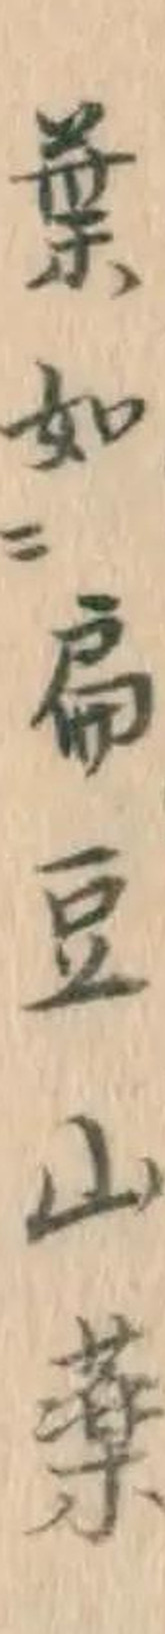葉如扁豆山薬
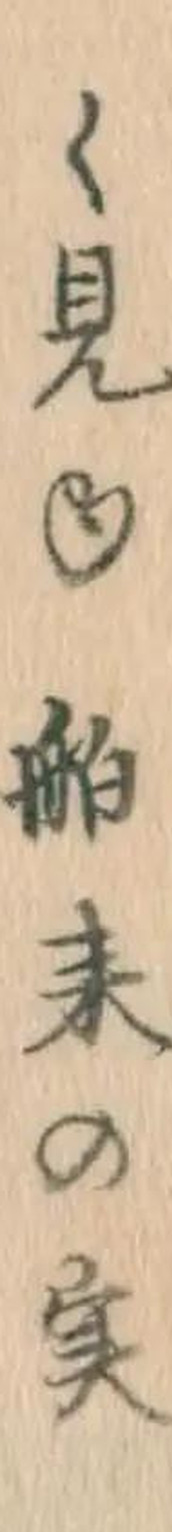く見ゆ舶来の実
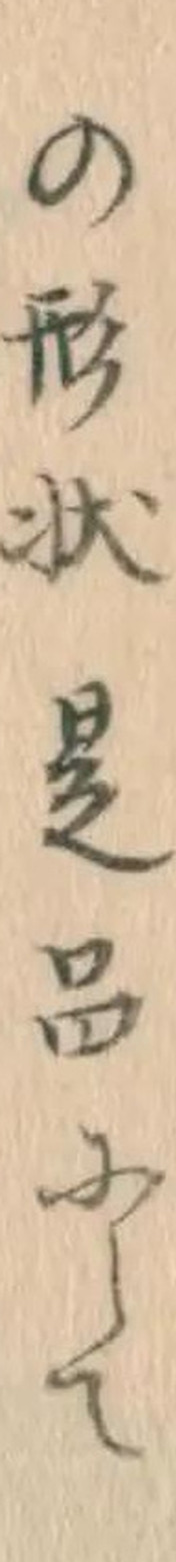の形状是品にして
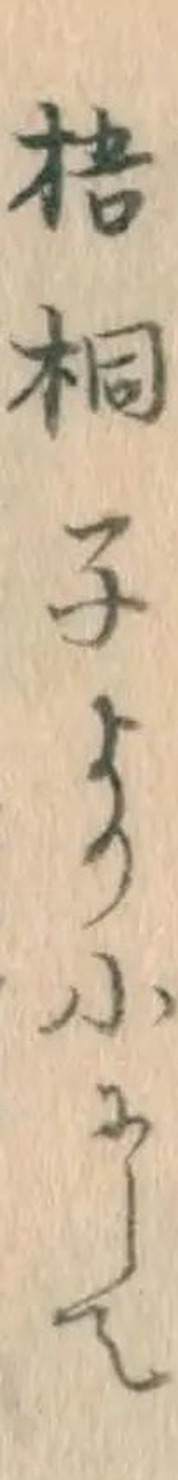梧桐子より小にして
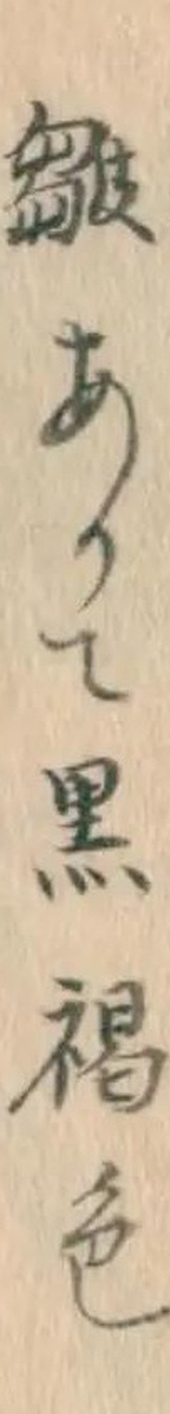雛ありて黒褐色
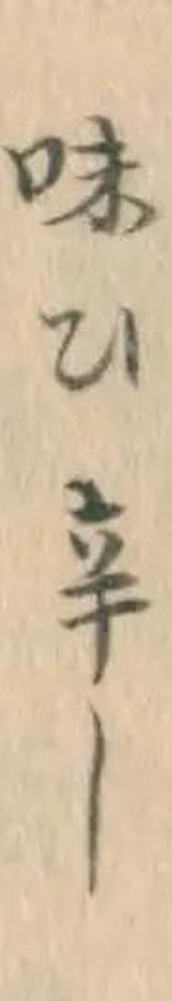味ひ辛し

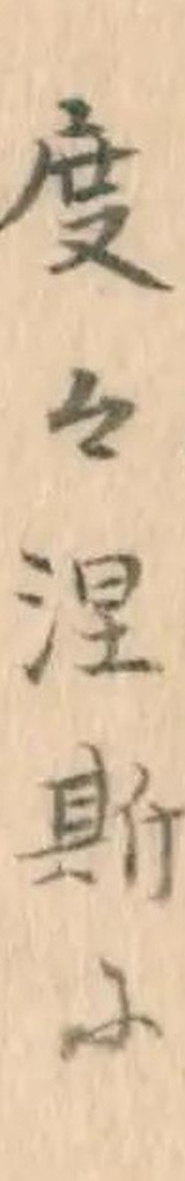度々涅斯に
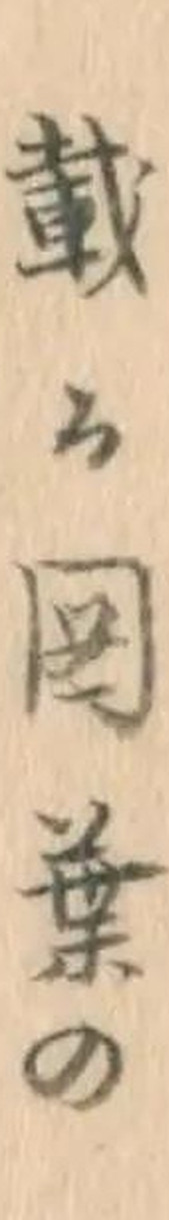載る図葉の
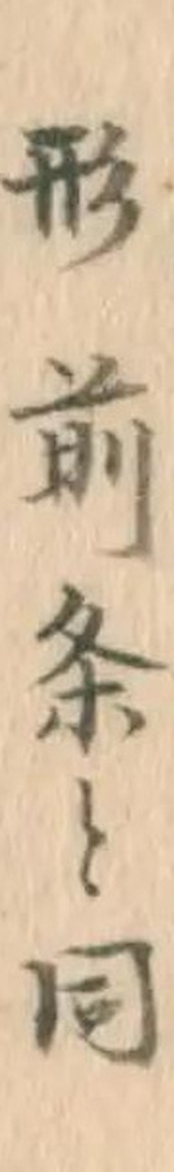形前条と同
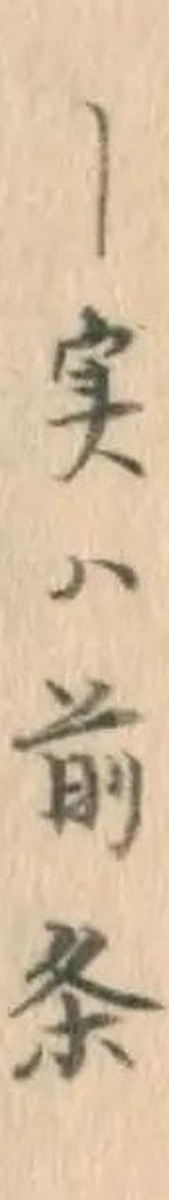し実は前条
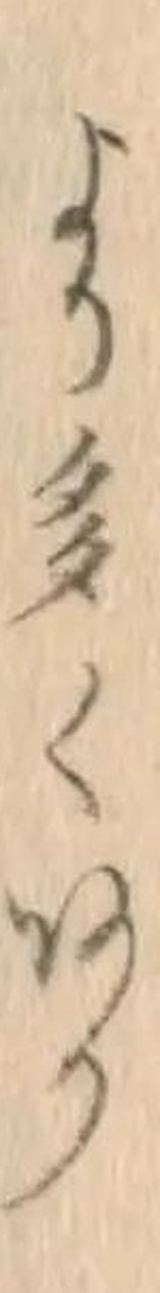より多くあり
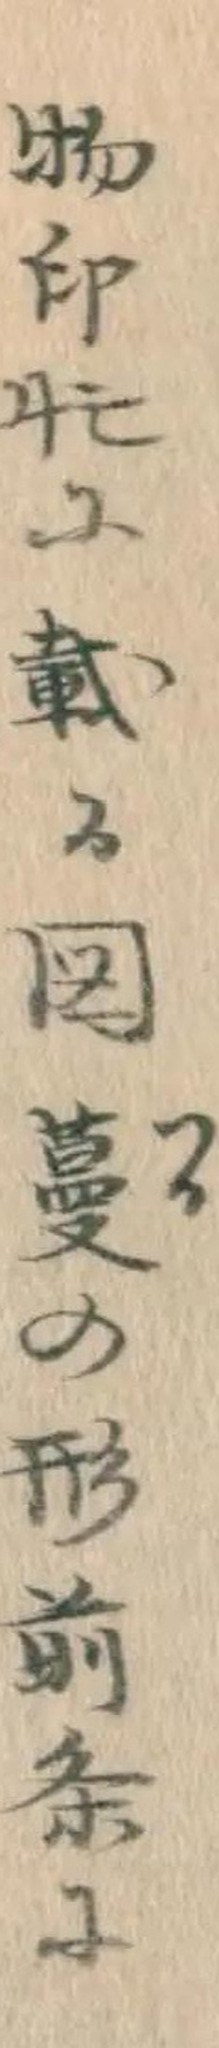物印に載る図蔓の形前条に
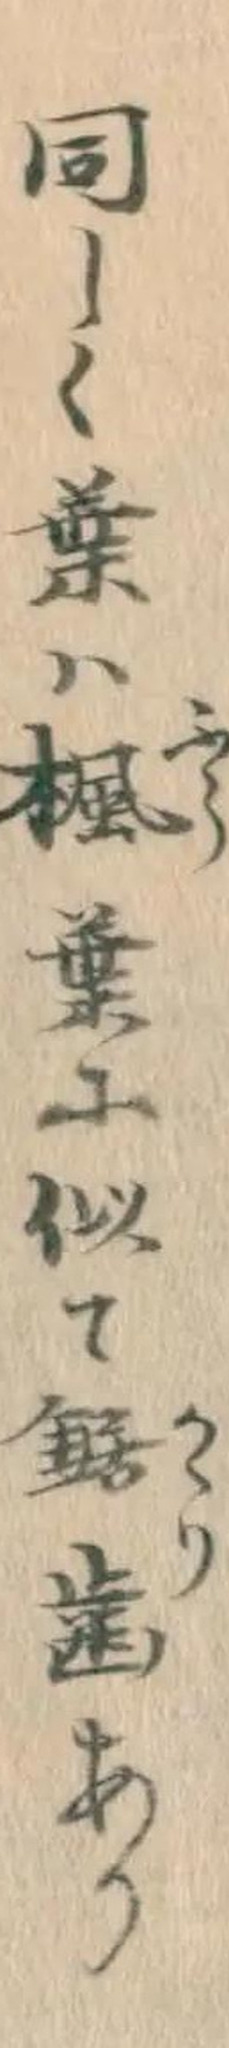同しく葉は楓葉に似て鋸歯あり
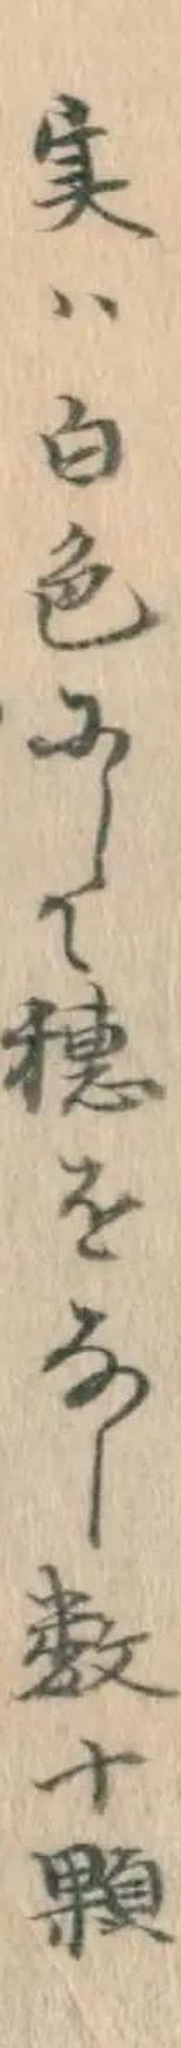実は白色にして穂をなし数十顆
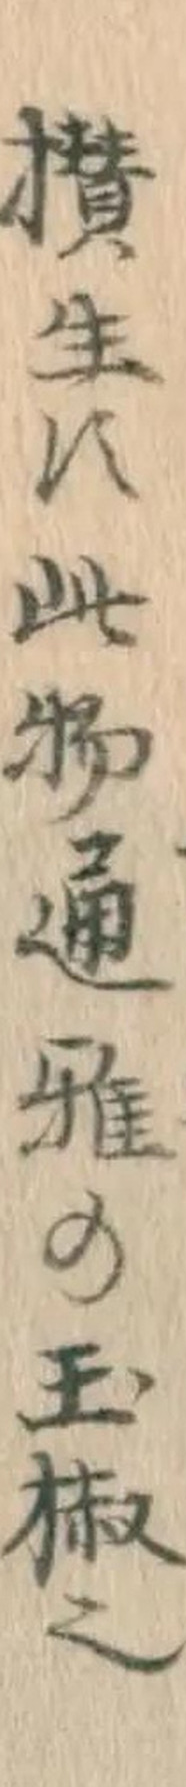攅生す此物通雅の玉椒也

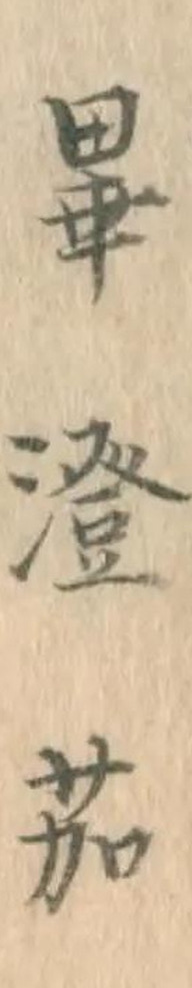畢澄茄
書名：本草図譜. 巻70-72
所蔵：国立国会図書館 National Diet Library, JAPAN
